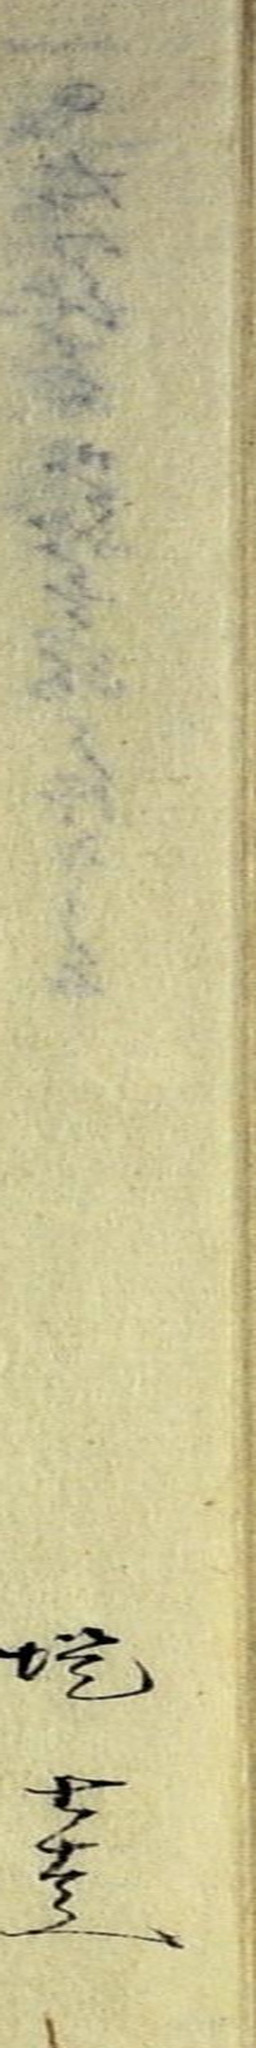堤七大夫
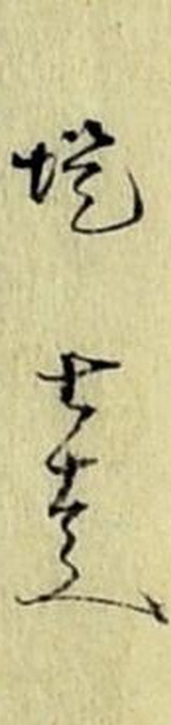堤七大夫
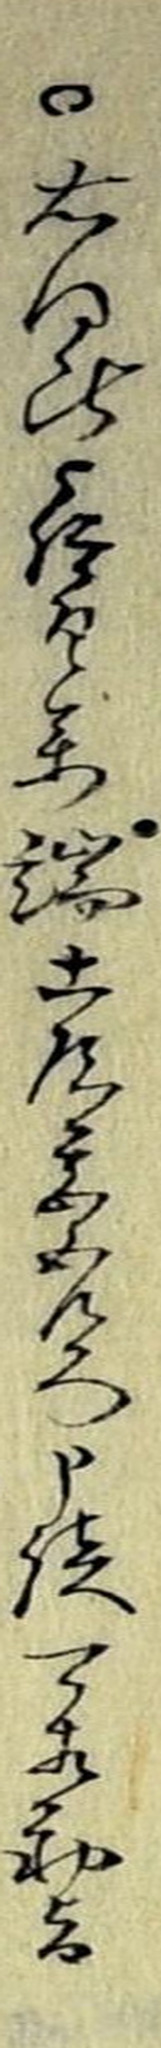〇右同断被仰付候万端土屋甚五左衛門申談可相勤旨
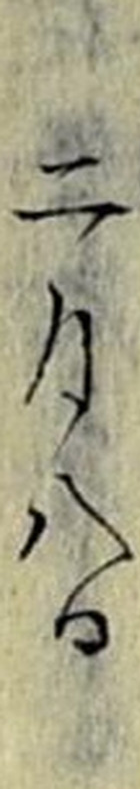二月八日
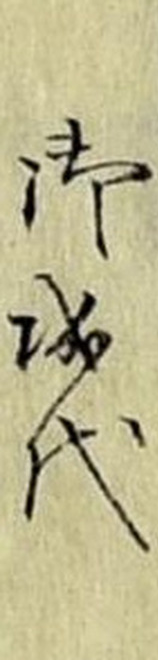御城代
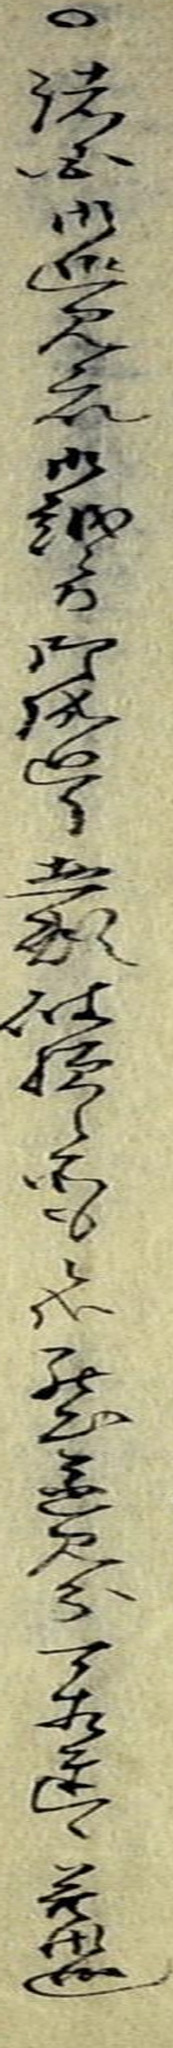〇諸国御巡見衆御越候付御城廻り惣頬破損之所も候哉罷出遂見分可相達候并御巡
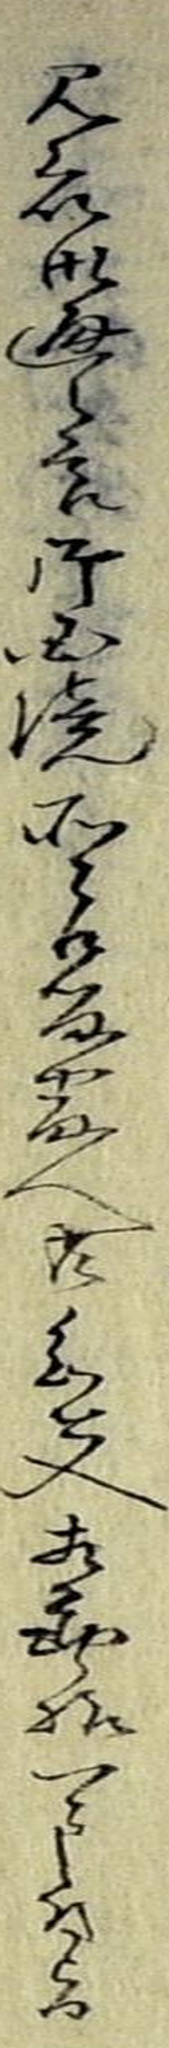見衆御通之節御国境所々口留番人共念を入相勤候様可申付旨
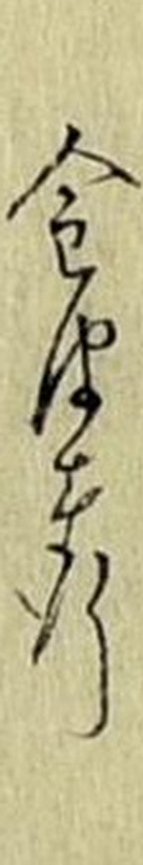金津奉行
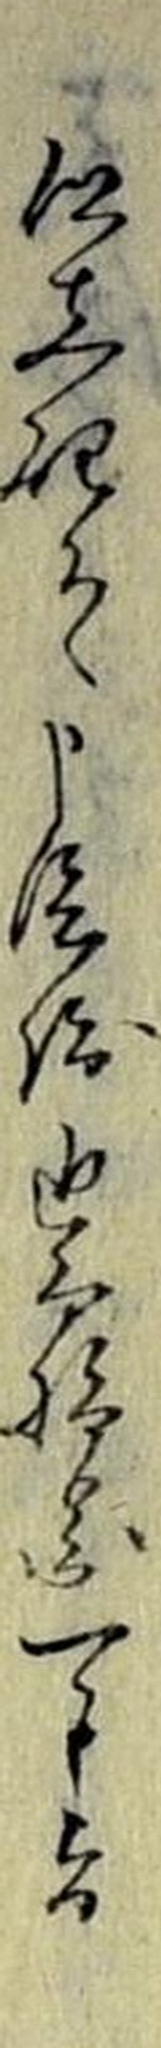但支配下へ申渡儀追而指図可申旨
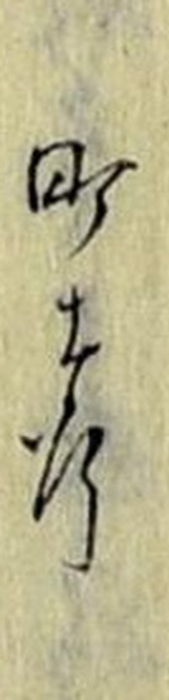町奉行
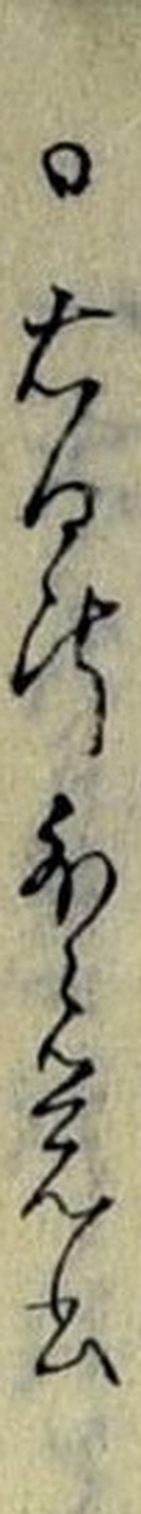〇右同断外ニ覚書
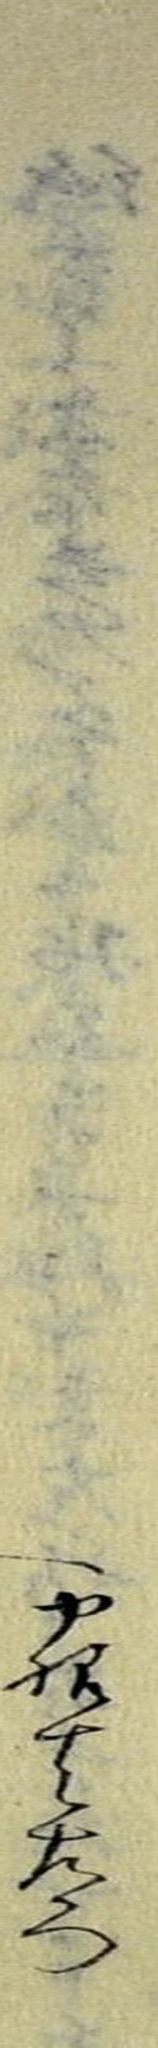中根十郎左衛門
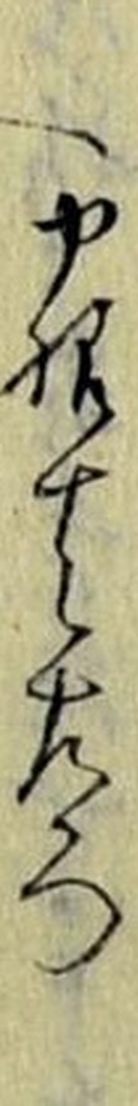中根十郎左衛門
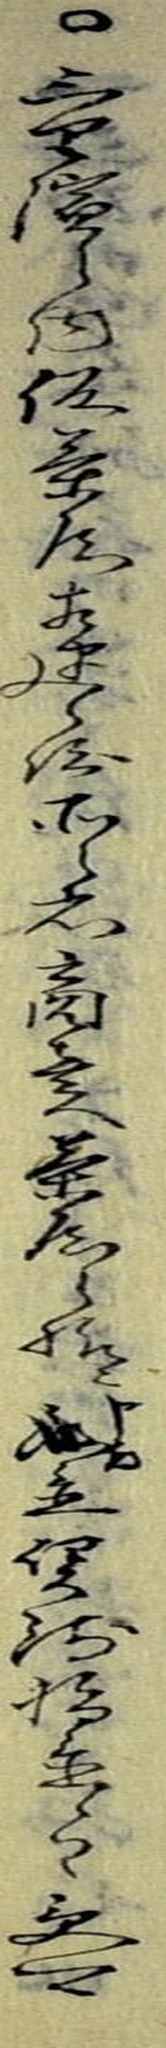〇三里浜之内仮茶屋相建候儀所之者商売茶屋之様ニ申付置賃銭指置候ハヽ受可
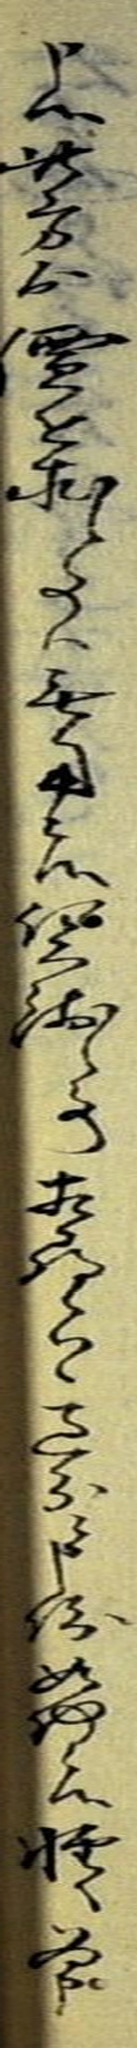申候此方ゟ価を求候事ハ無用ニ候賃銭之事相尋候ハヽ過分ニ申儀如何ニ候軽く為申
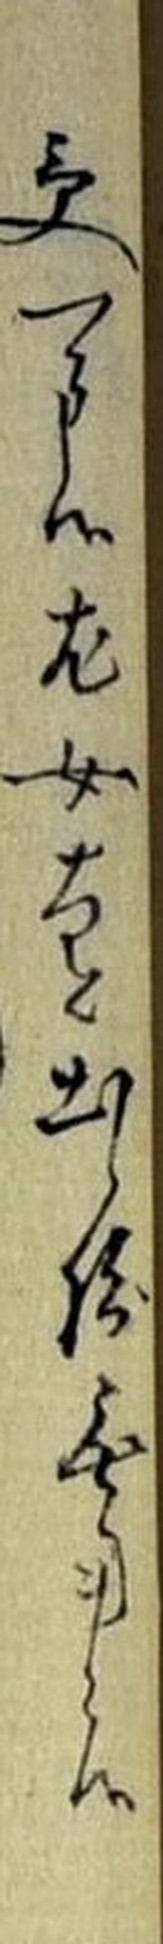受可申候尤女なと出候儀無用ニ候
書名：命令之部 一
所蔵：福井県文書館 Fukui Prefectural Archives
